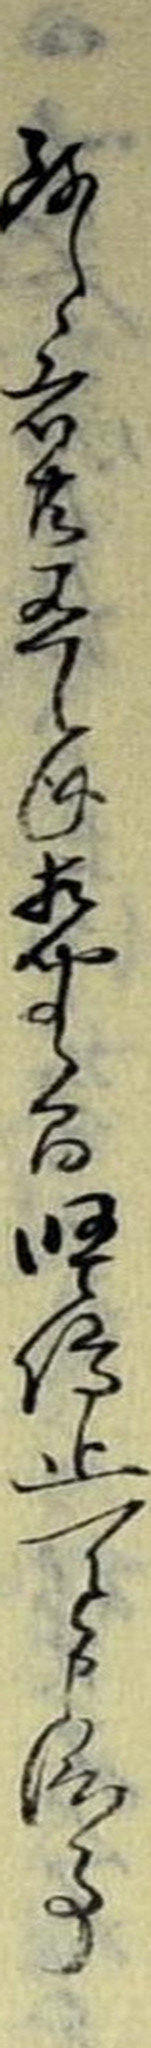致し候者共有之趣相聞候間堅停止可被申渡事
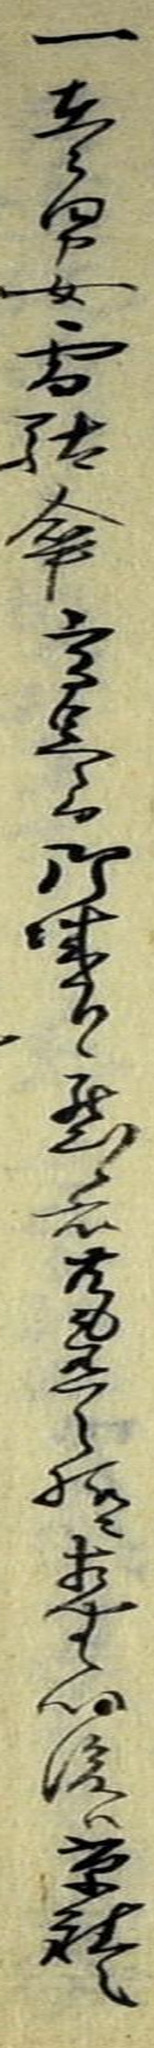一在々男女雪駄傘高足に而御城下へ罷出候者共も有之様に相聞候以後は草鞋之
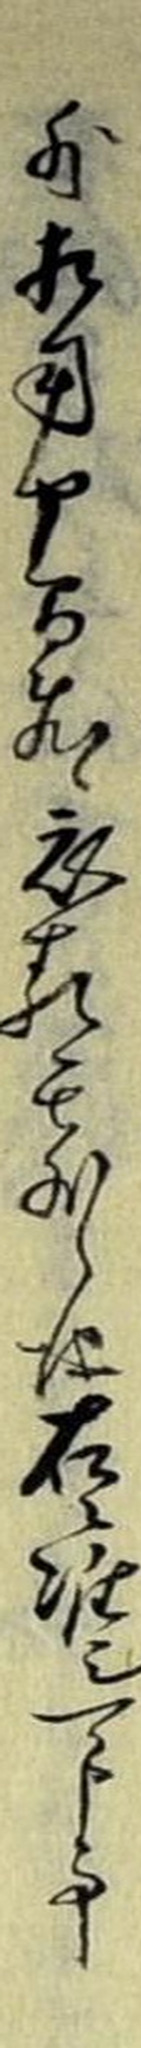外相用申間敷候衣類其外之儀右に准し可申事
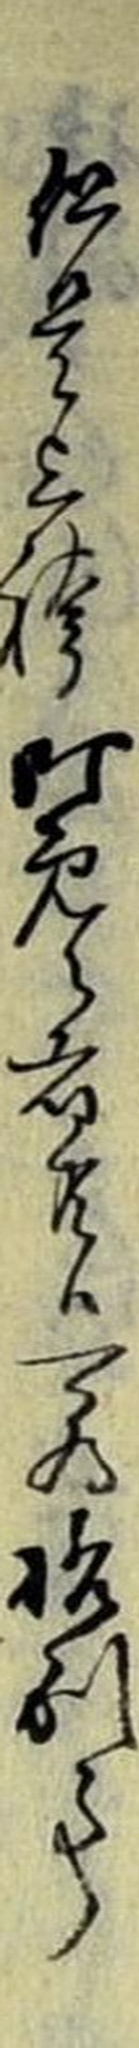但是迄袴御免之者共は可為格別事
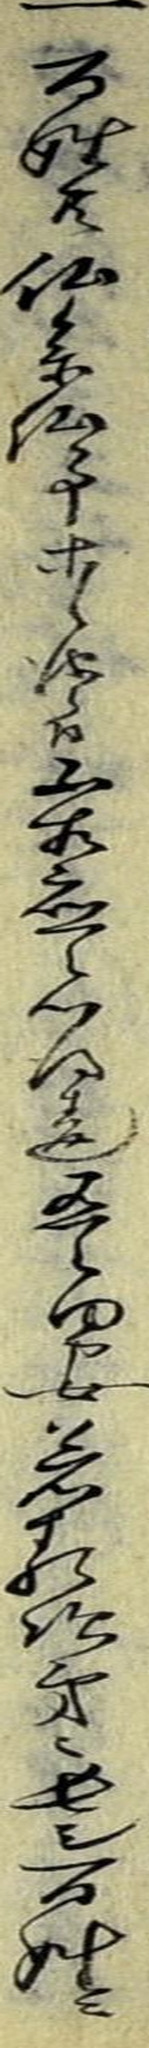一百姓共仏参仏事等之儀に付不相応之心得違有之男女着類次第に長し百姓に
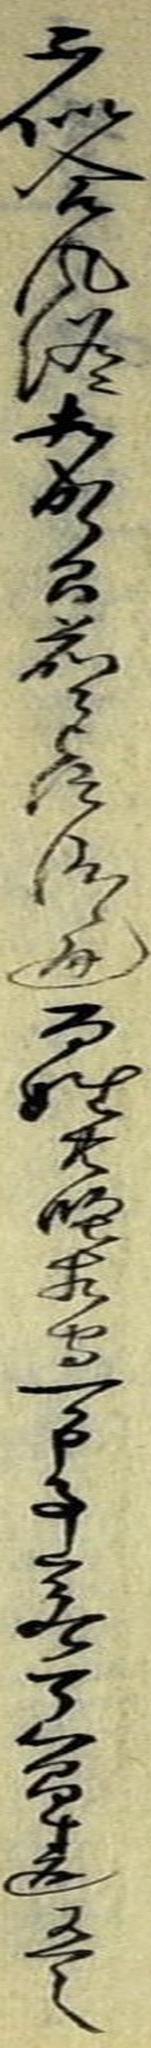不似合風俗に相成候間前に被仰渡候通百姓共堅相守可申事若了簡違有之
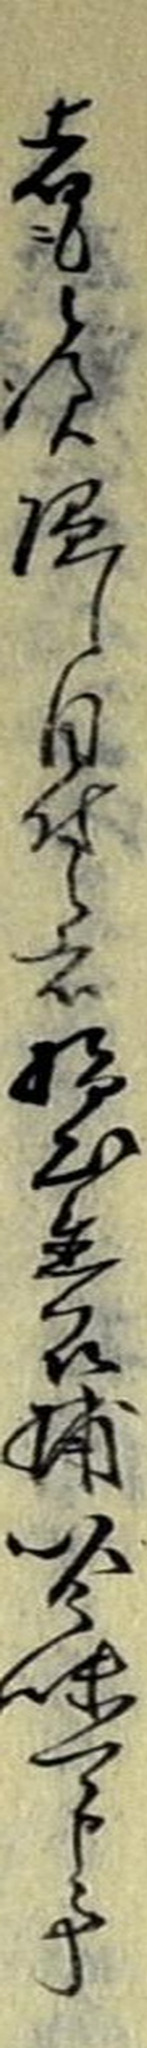者も候得は隠し目付之者指出置召捕吟味可申事
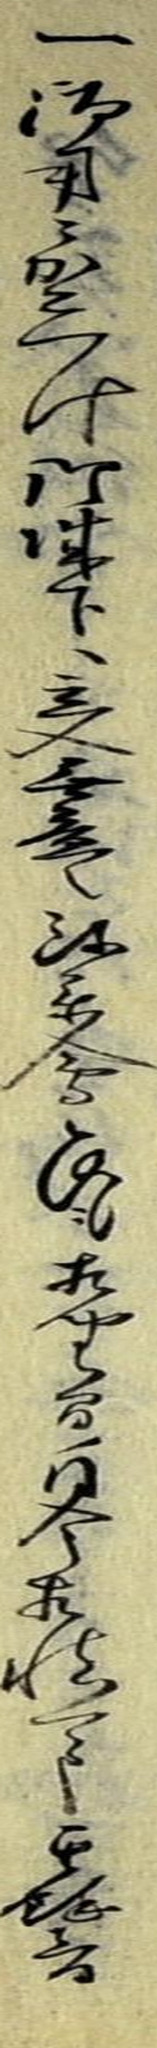一御用にかこつけ御城下へ立入無益之致参会候趣も相聞候間自今相慎可申其余音
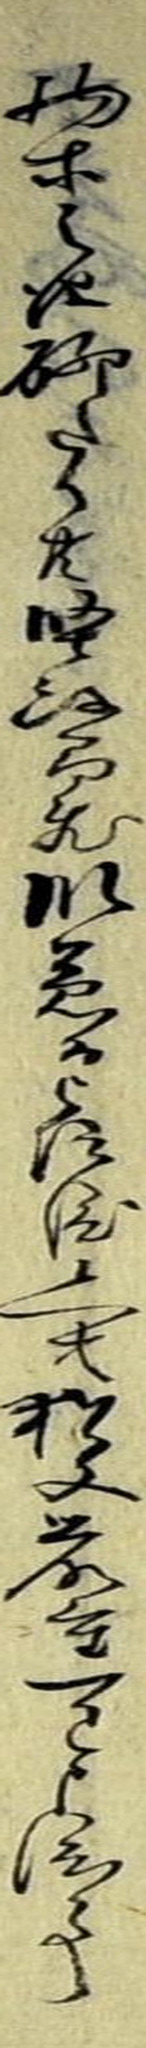物等之儀聊たり共堅致間敷段兼而被仰渡候へ共猶又厳重可被申渡事
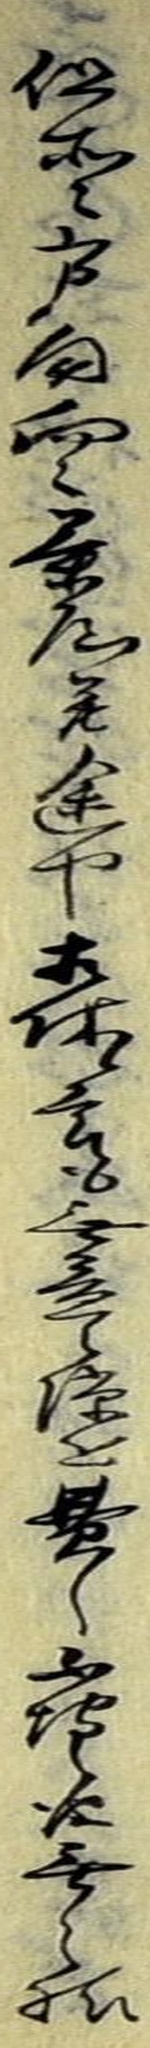但所々方角向々茶屋并途中相休候節も無益之隙を費し不埒之儀無之様
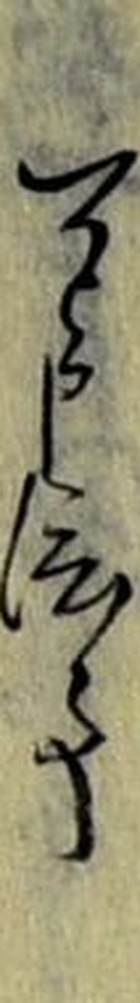可被申渡事
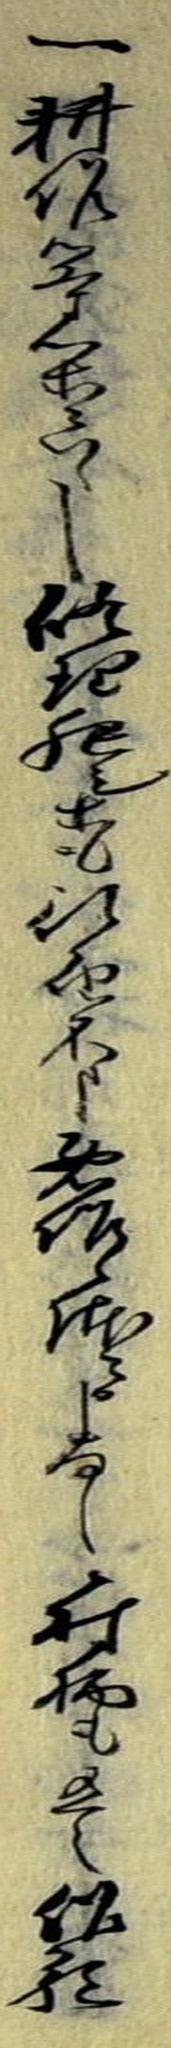一耕作等閑にいたし修理肥し等も行届不申悪作候体にも申なし候村柄も有之作難

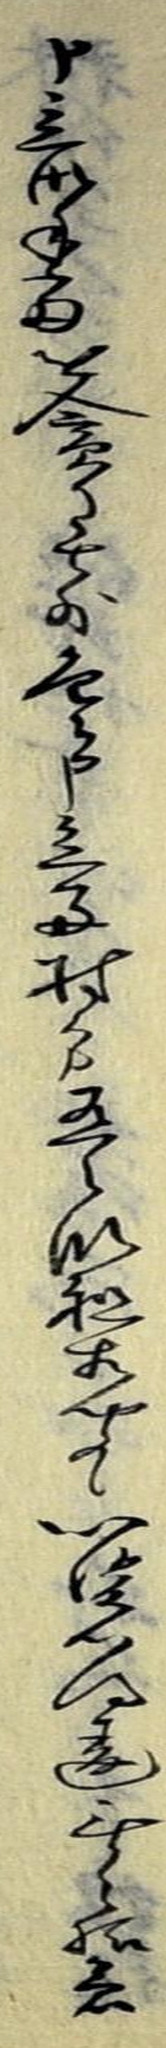申立御手当を貪り其外色々申立多村方有之段粗相聞候以後心得違無之様急
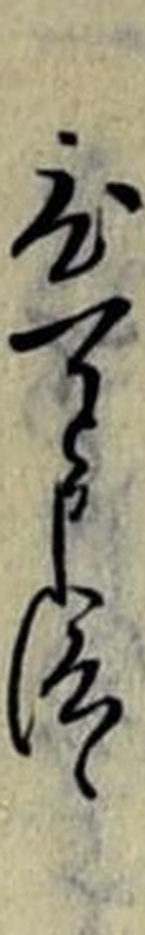度可被申渡候
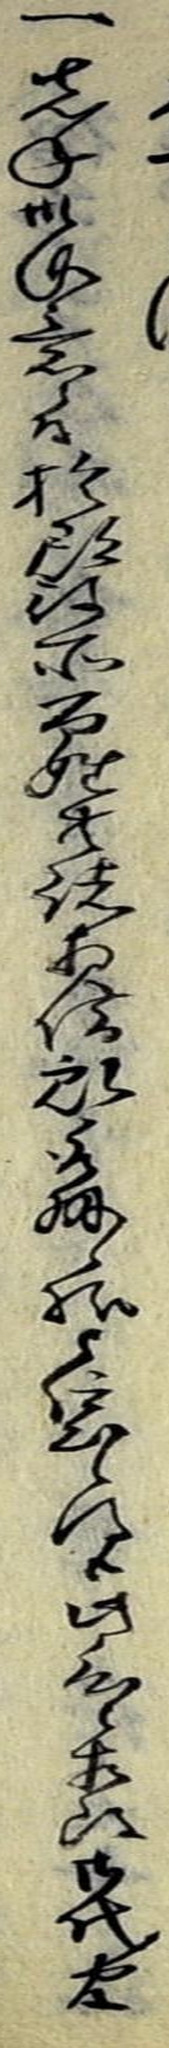一先年御趣意に付於郡役所百姓共諸拝借願取扱候様被仰出候得共此度被相改御代官
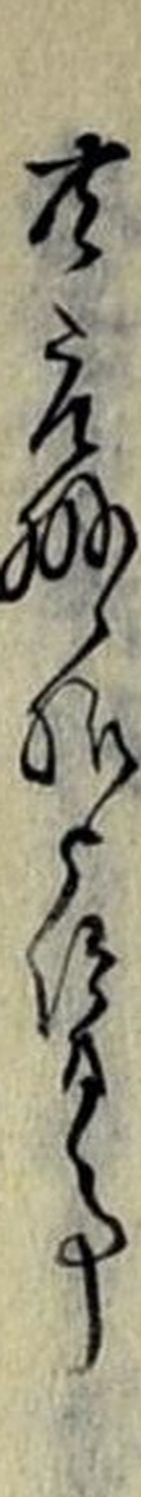共取扱候様被仰付事
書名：命令之部 二
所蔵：福井県文書館 Fukui Prefectural Archives
